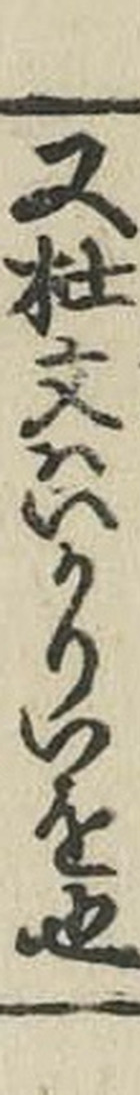又杜文はいかりいを也
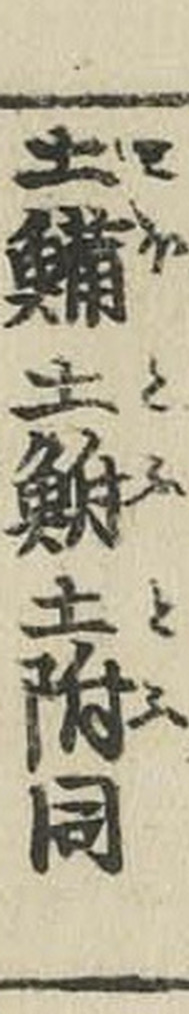土鯆土鮒土附同
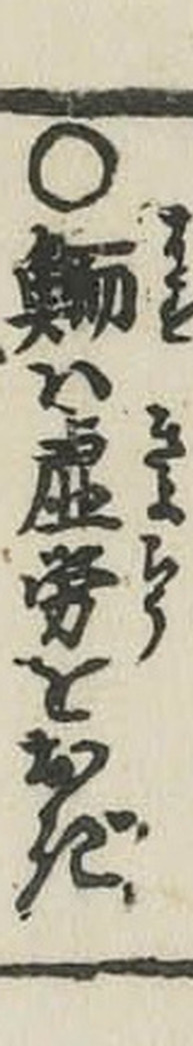○鮞は虚労をおぎ
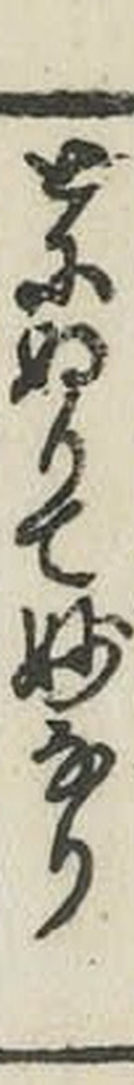どにぬりて妙なり
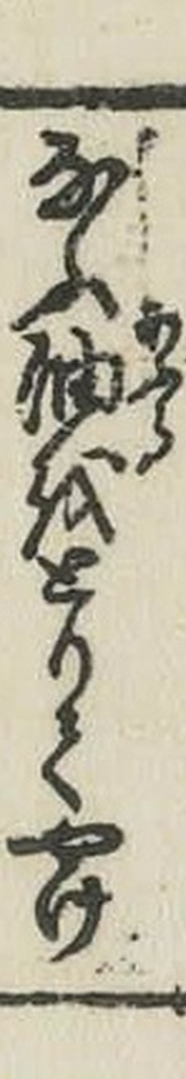なふ油をとりてやけ
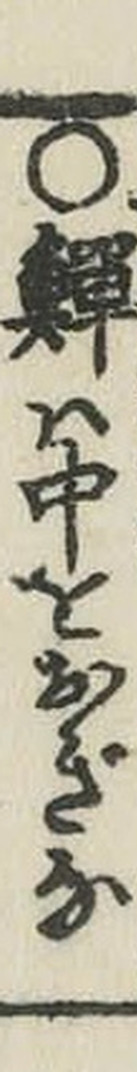○鱓は中をおぎな
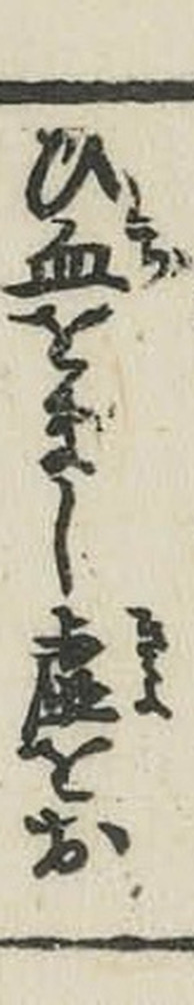ひ血をまし虚をお
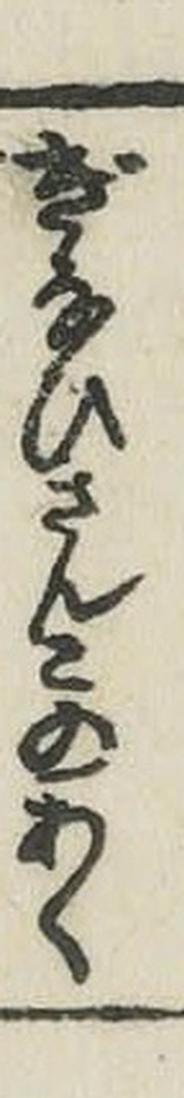ぎなひさんこのあく
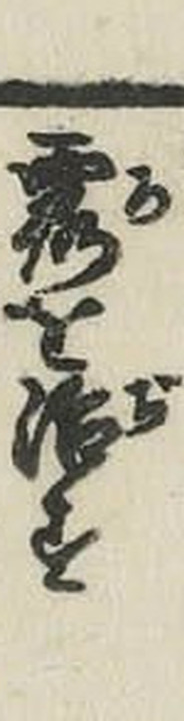露を治す
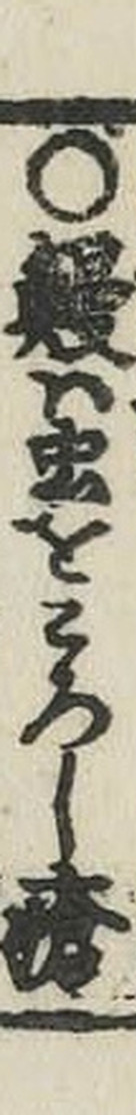○鰻は虫をころし瘡
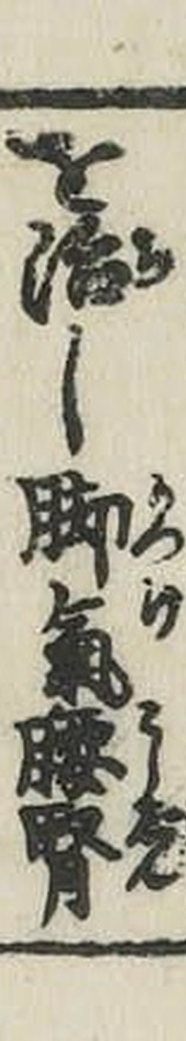を治し脚気腰腎
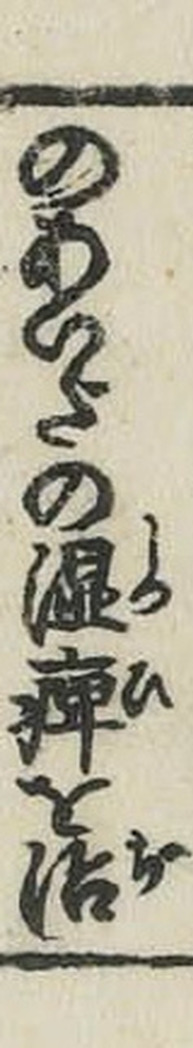のあいだの湿痺を治
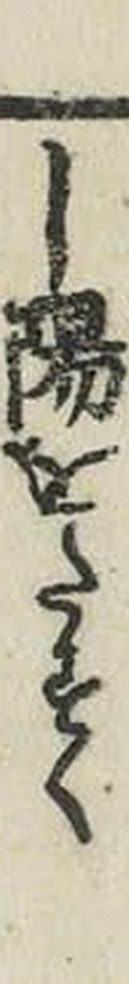し陽をたすく
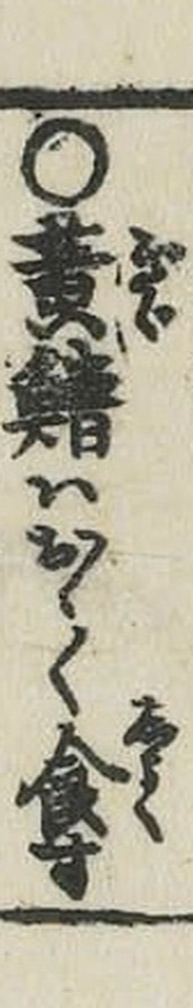○黄鱨はおゝく食す
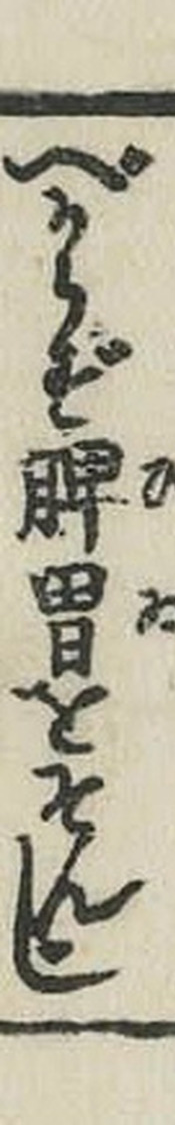べからず脾胃をそんじ
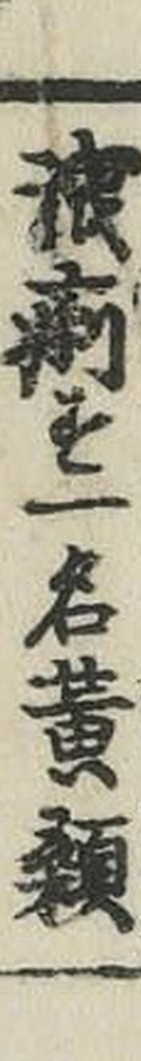洩痢す一名黄顙
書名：増補頭書訓蒙図彙大成 10巻 7:巻之14-16
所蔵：東京学芸大学教育コンテンツアーカイブ
